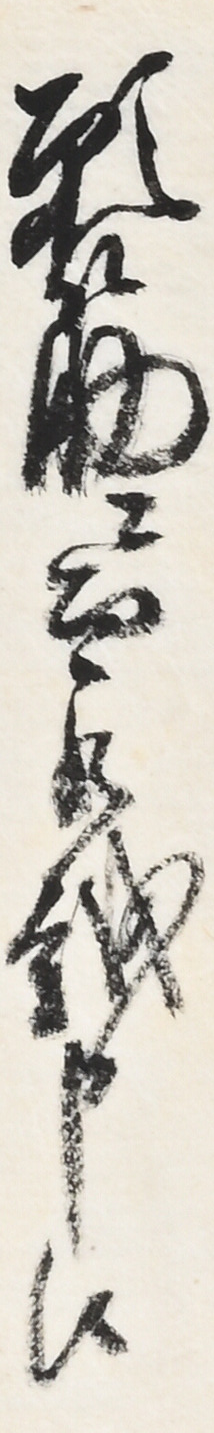願筋ニ而罷越申候
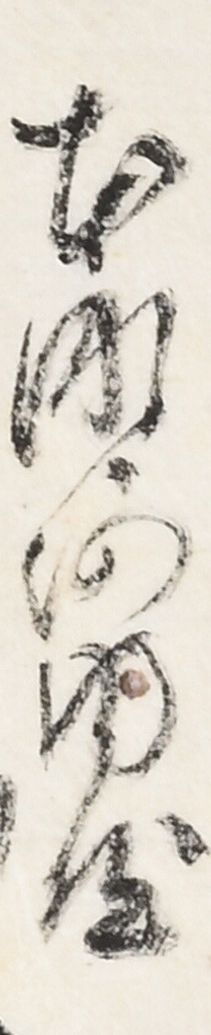本町河内屋
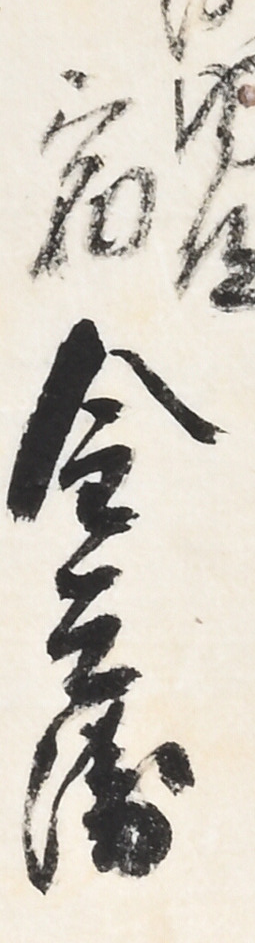宿金兵衛
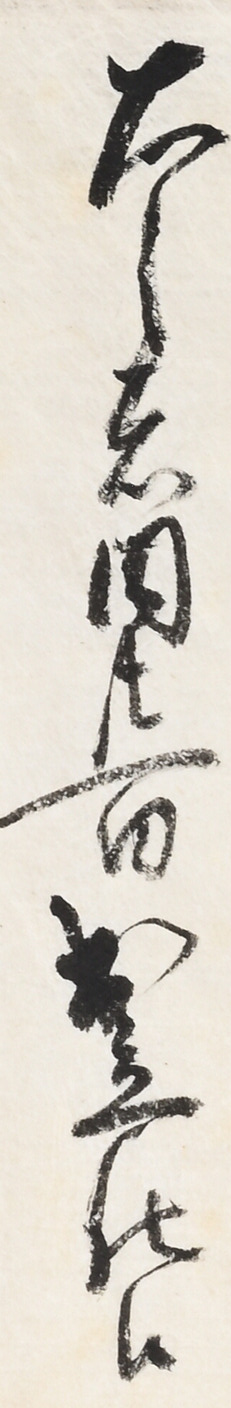右之者同廿一日出立仕候
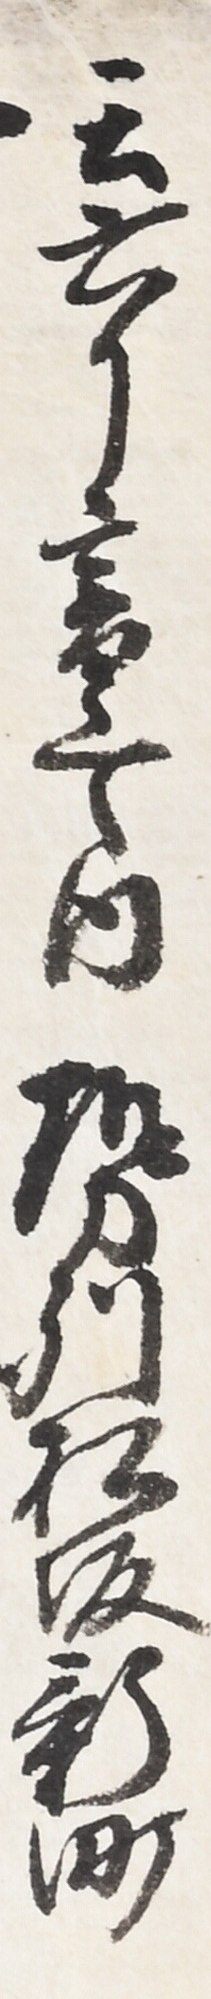壬六月書上之内勢州松坂新町
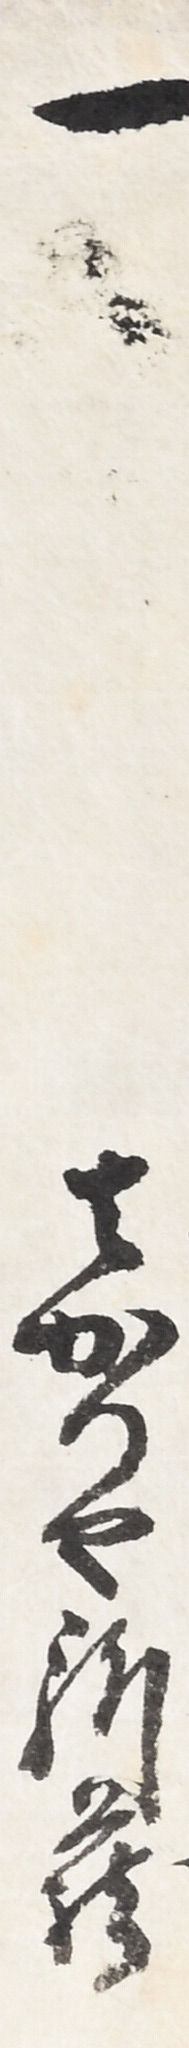一はかりや新蔵
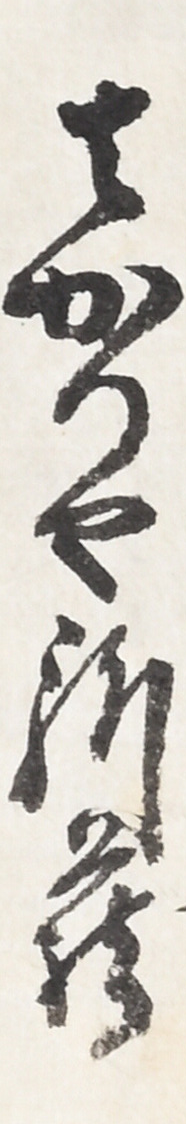一はかりや新蔵
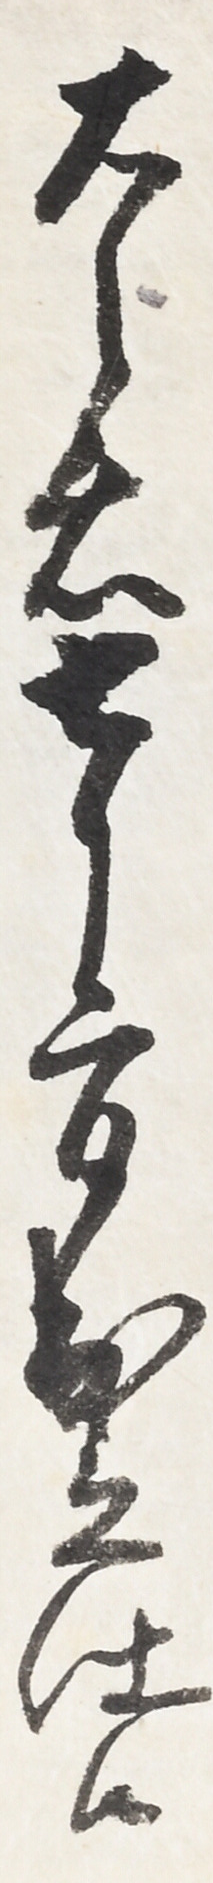右之者七月二日出立仕候
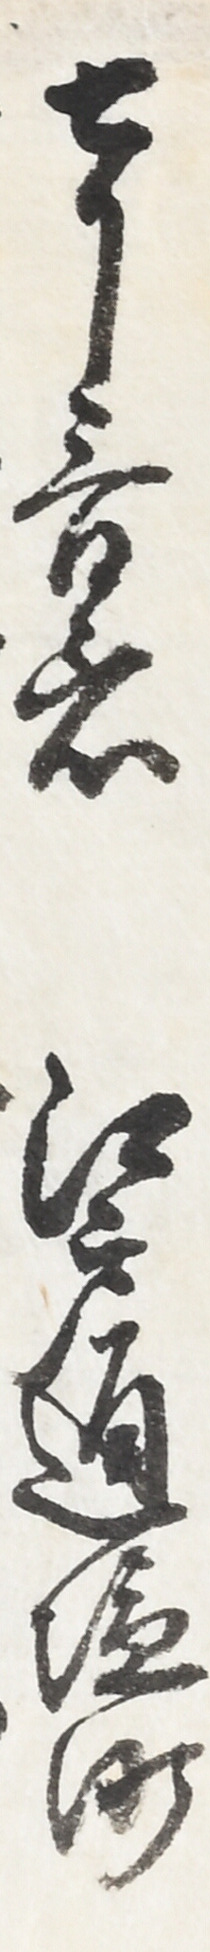七月三日着江戸通塩町
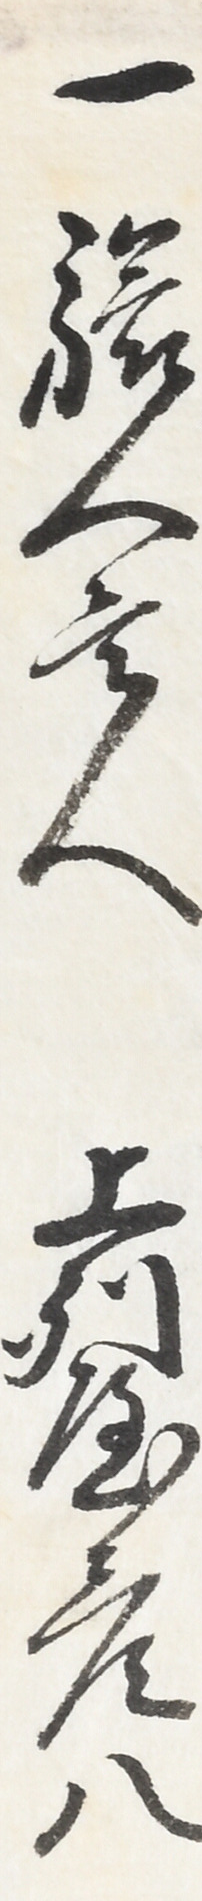一旅人壱人上州屋彦八
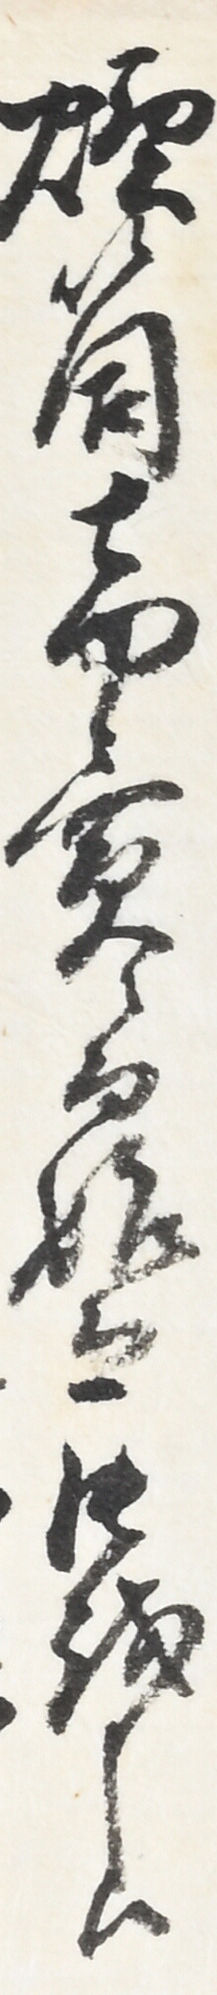煙筒商売ニ而始而罷越申候
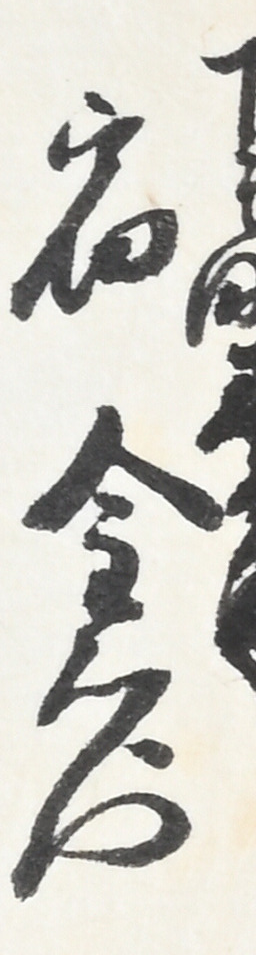宿金右衛門
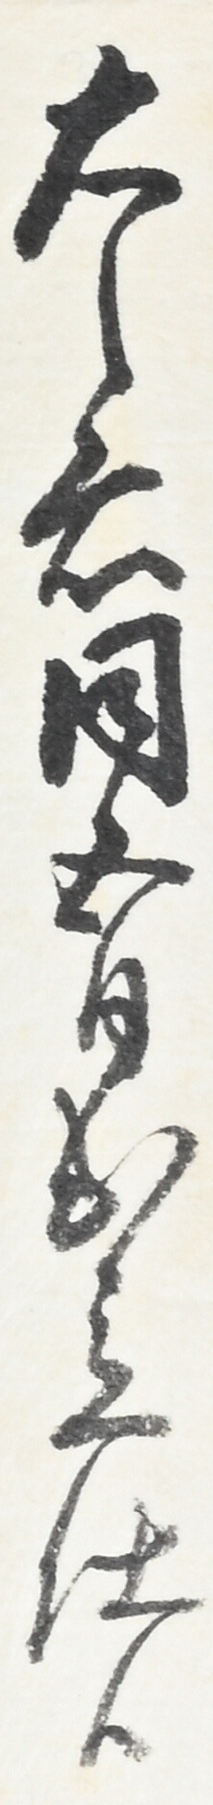右之者同五日出立仕候
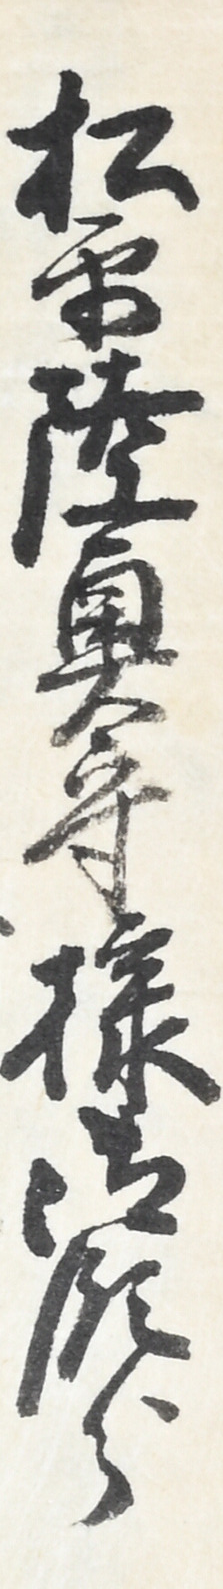松平丹波守様御領分

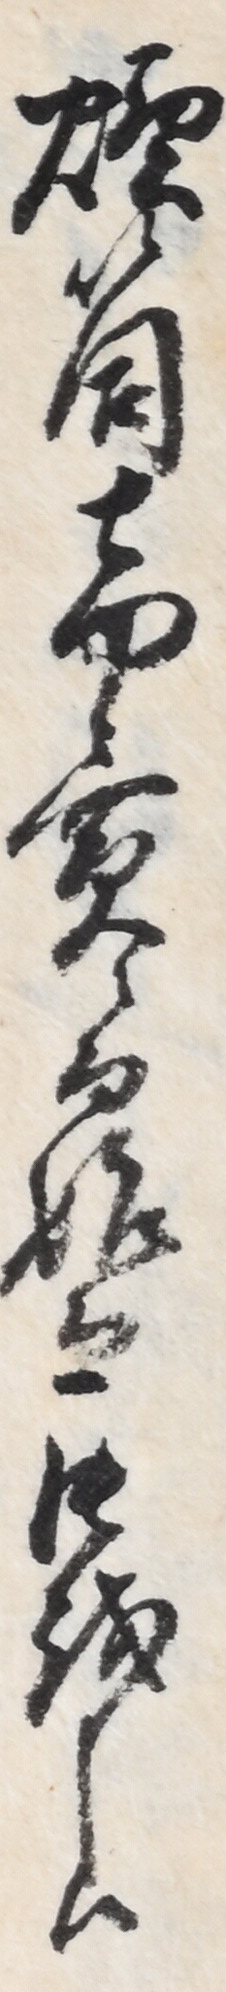薬商売ニ而始而罷越申候
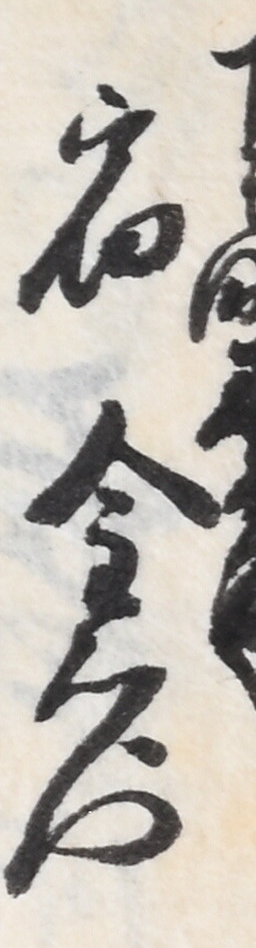宿金右衛門
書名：旅人泊控帳
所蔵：伊那市立高遠町図書館・合同会社AMANE
